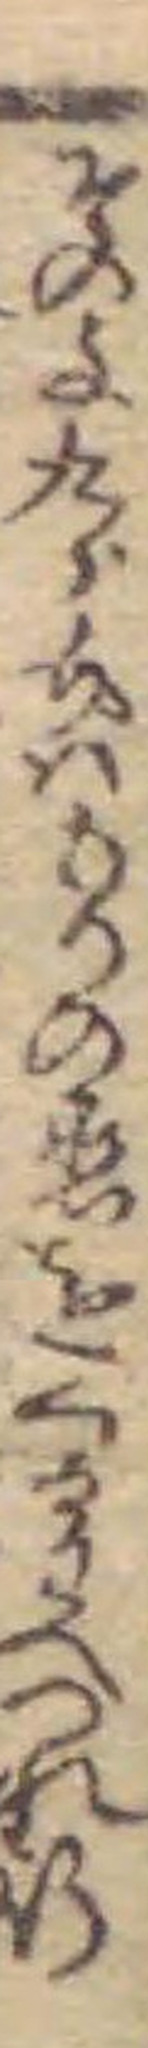そのよ九郎介はもりの丞をくるわへつれ行
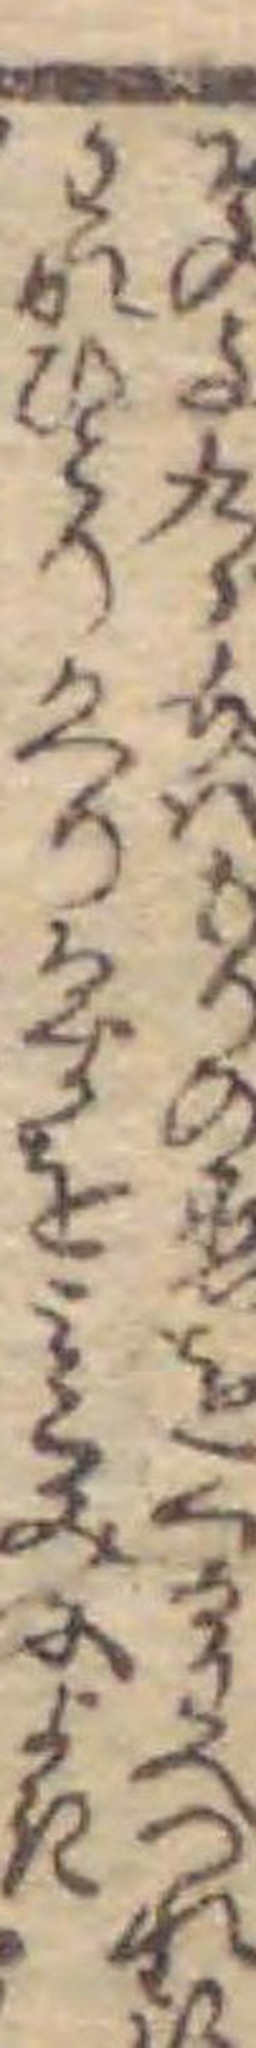われひとりかへりるすをみこみによき
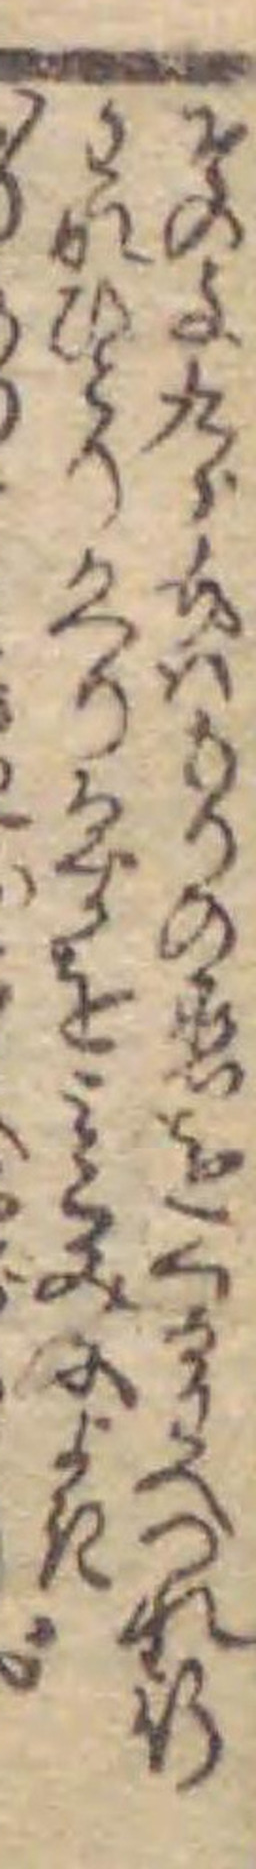われひとりかへりるすをみこみによき
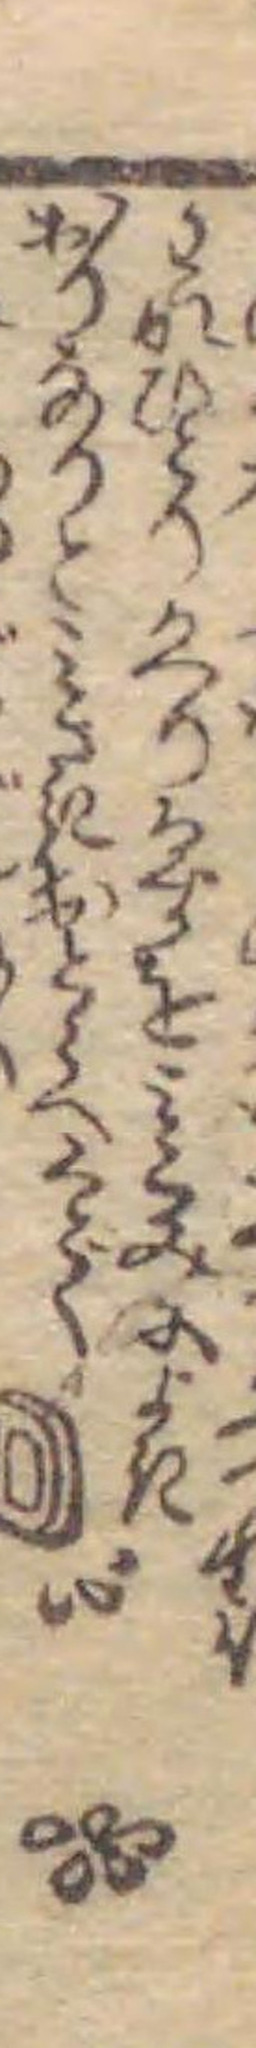おりなりとみさき出とらへてくどく
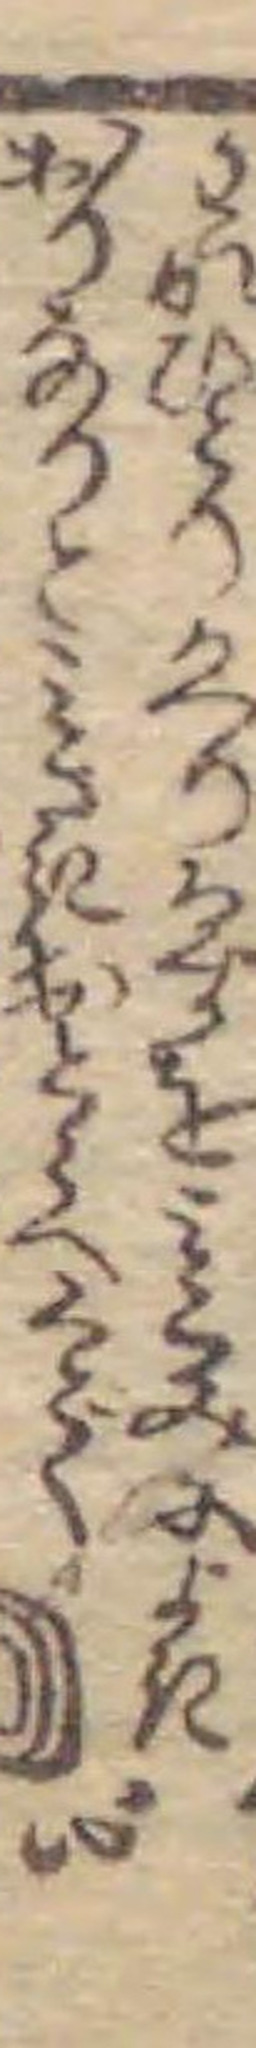おりなりとみさき出とらへてくどく
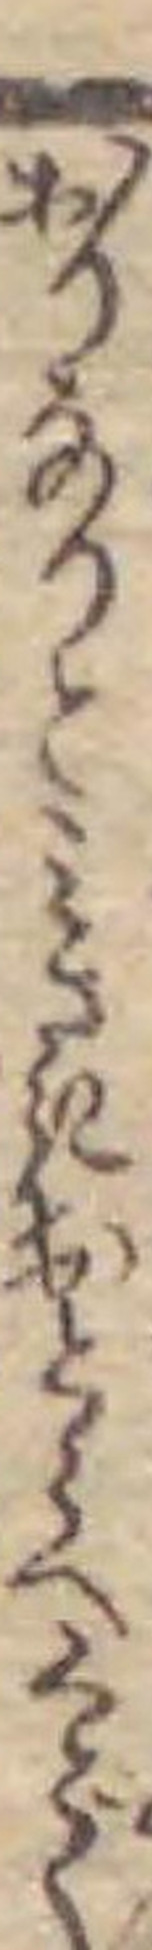おりなりとみさき出とらへてくどく
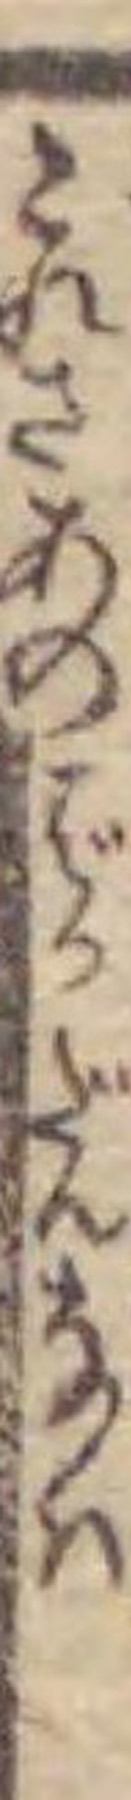これさあのばかだんなは
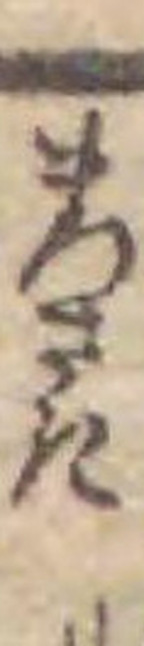まつさき
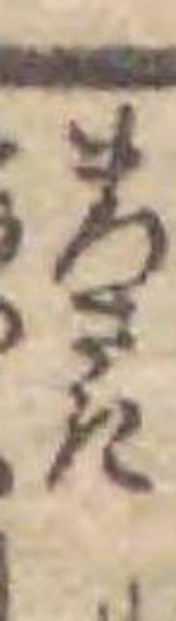まつさき
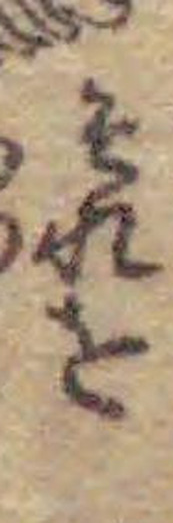それを
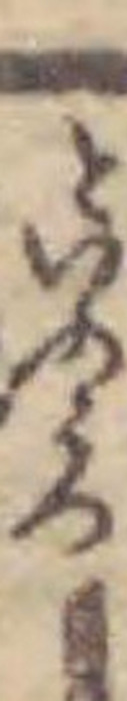といふうつ
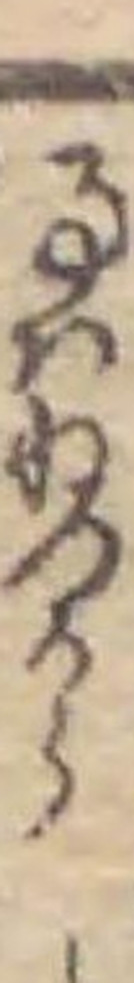事はねつから
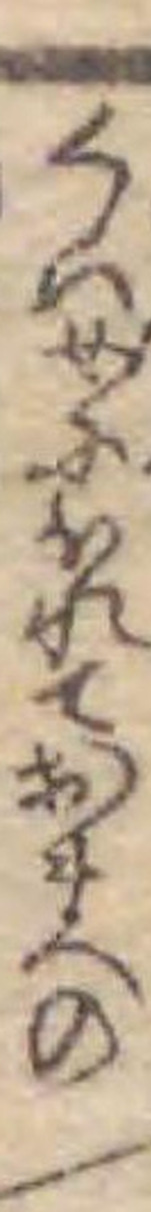くしい女にほれておまへの
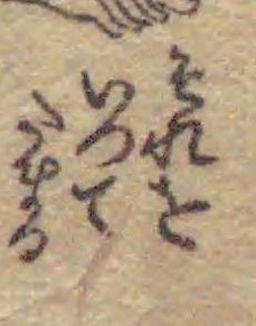こまる
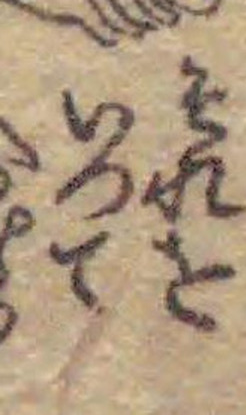いつて
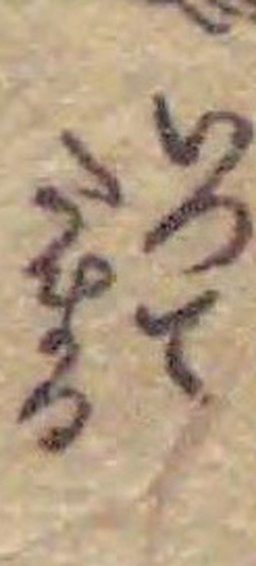こまる
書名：扨化狐通人 : 2巻
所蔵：国立国会図書館 National Diet Library, JAPAN
